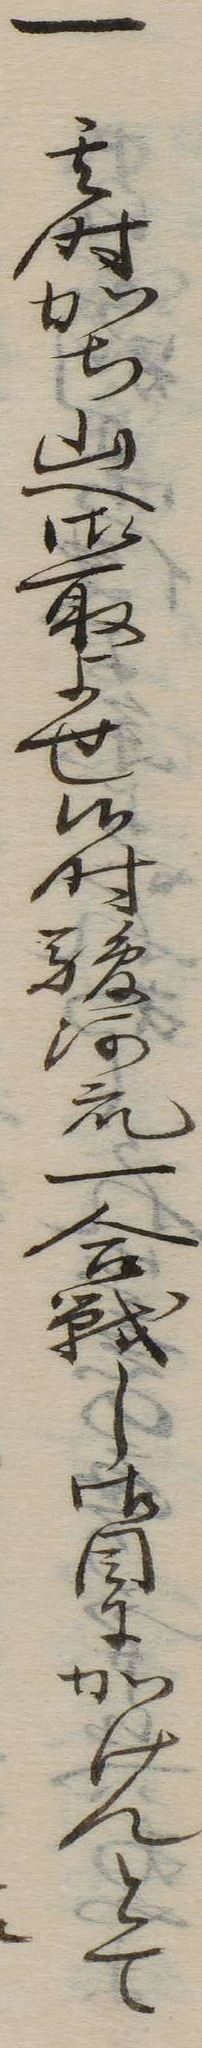一其時かち山へ御取よせ候時駿河衆一合戦し御目にかけんとて
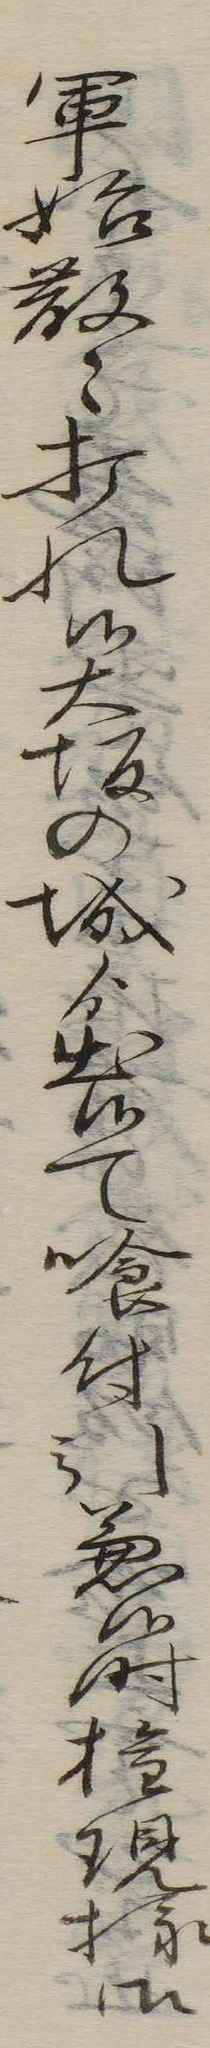軍始数々打れ候大阪の城ゟ出候て喰付引兼候時権現様御
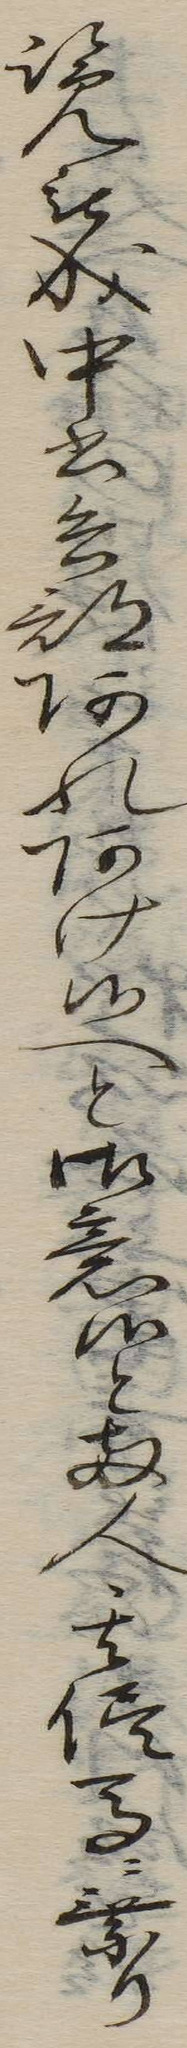覧被成中出兵部あれあけ候へと御意候と両人其侭馬ニ乗り
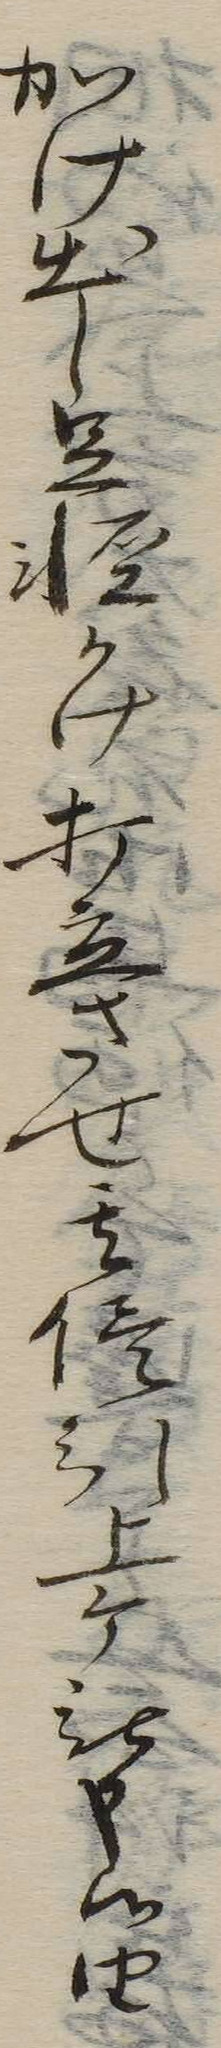かけ出し足軽かけ打立させ其侭引上ケ被申候由
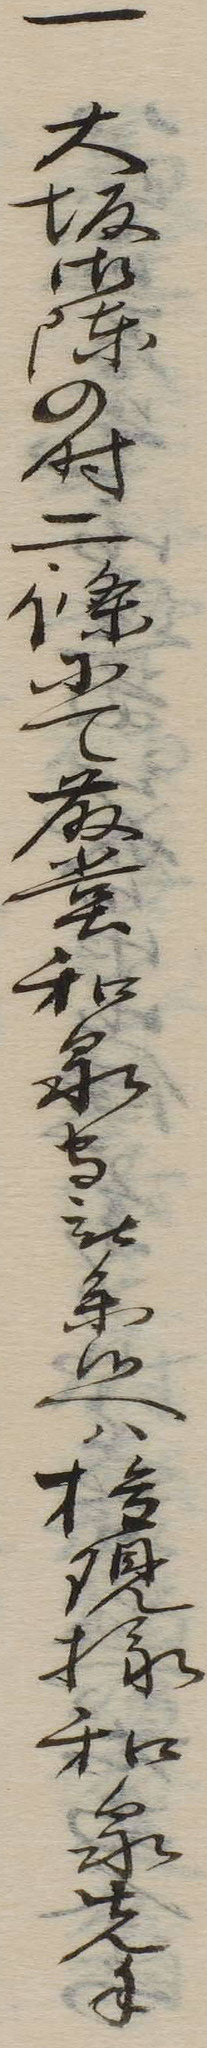一大坂御陣の時二条にて藤堂和泉守被参候へは権現様和泉先手
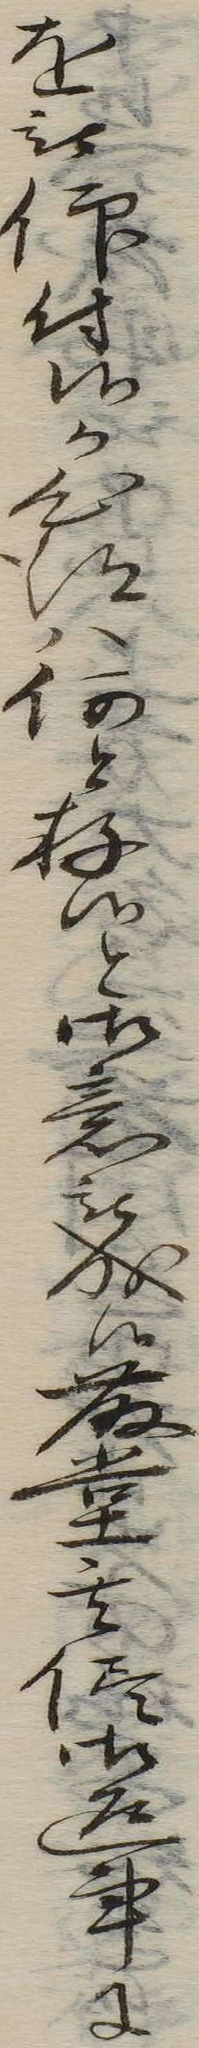を被仰付候か心得は何と存候と御意被成候藤堂其侭御返事に
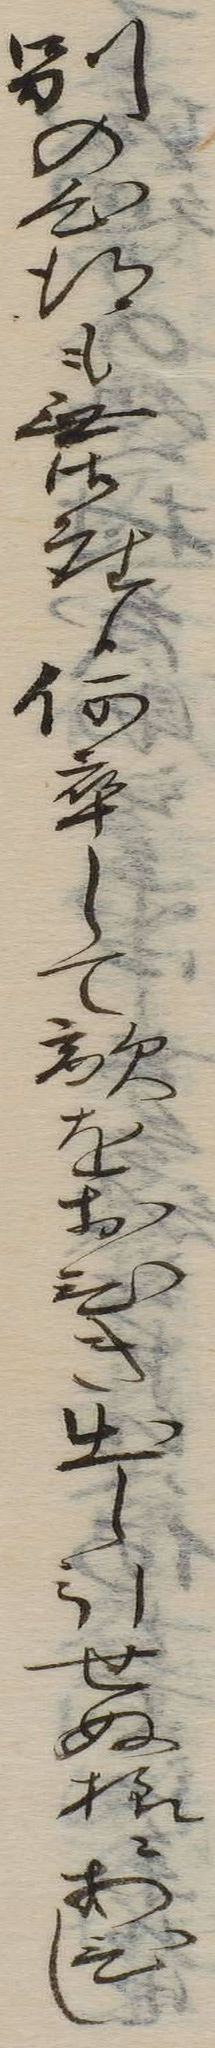別の心得も無御座候何卒して敵をおひき出し引せぬ様ニあひし
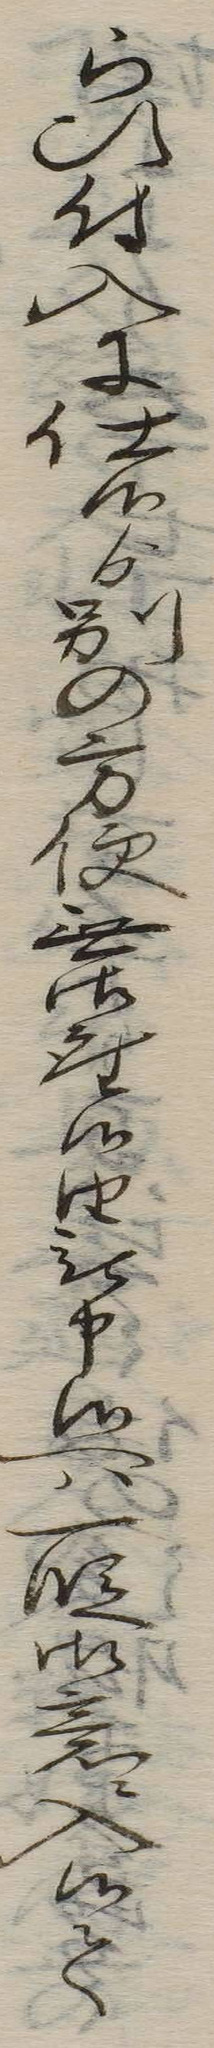らひ付入に仕候ゟ別の方便無御座候由被申候へは一段御意ニ入候て
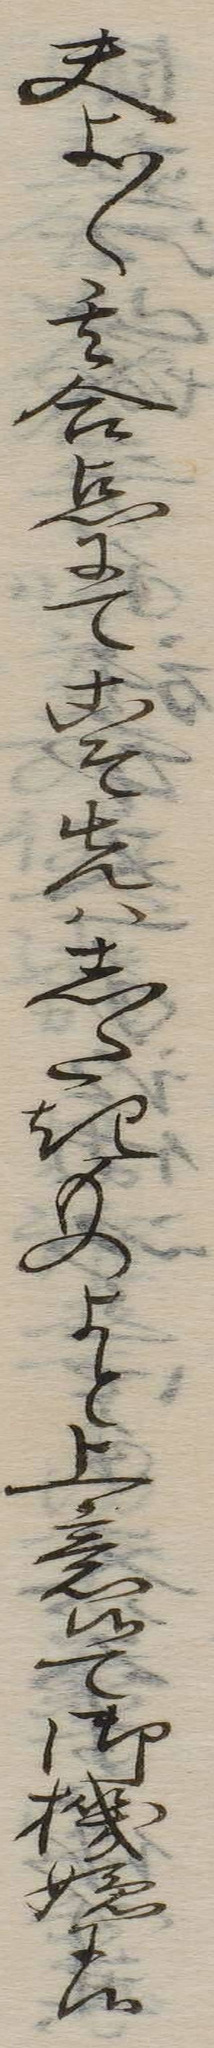夫よく〳〵其合点にてこそ先はしたきものよと上位候てご機嫌に候
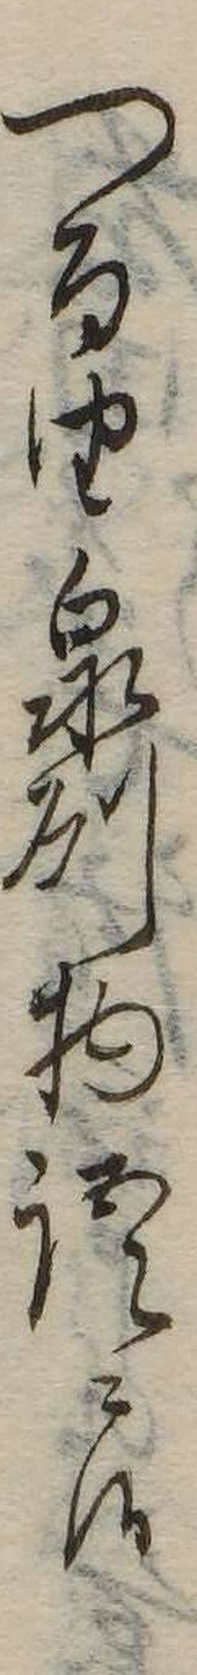つる由泉州物語ニ候
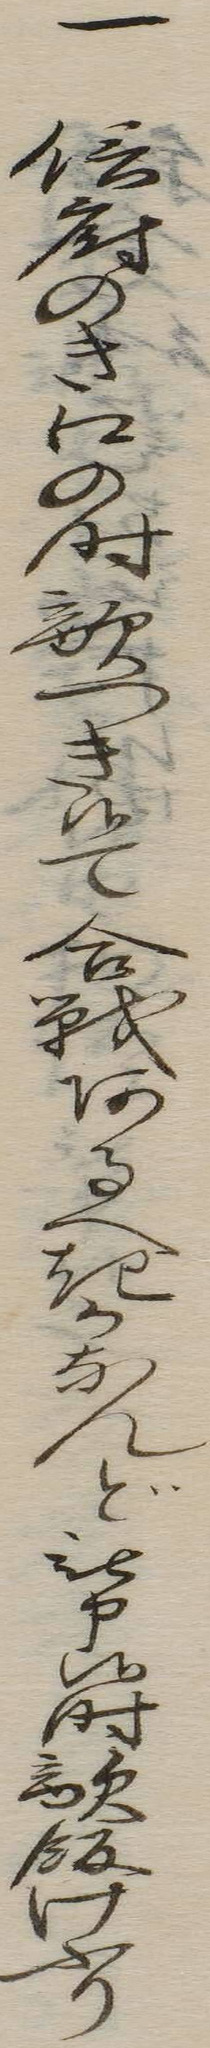一信府のき口の時敵つき候て合戦あるへきかなんど被申候時敵飯けふり
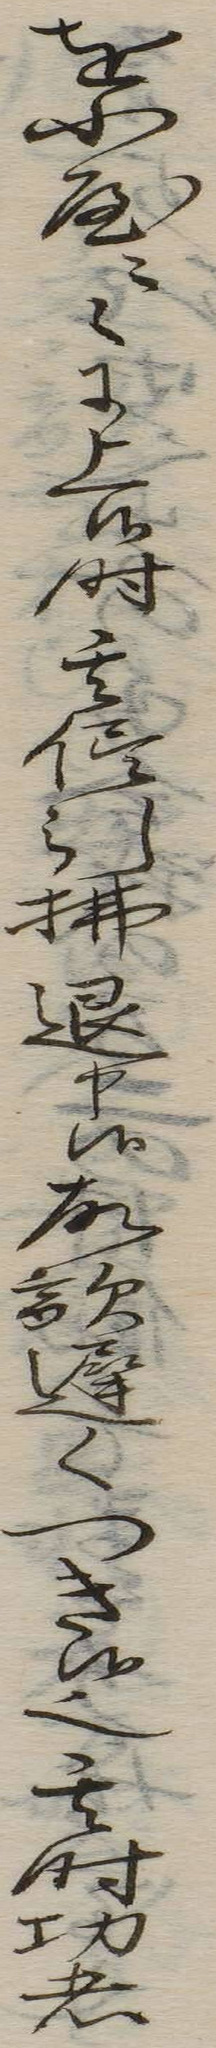を小屋々々に上候時其侭引き払退申候故敵遅くつき候也其時巧者
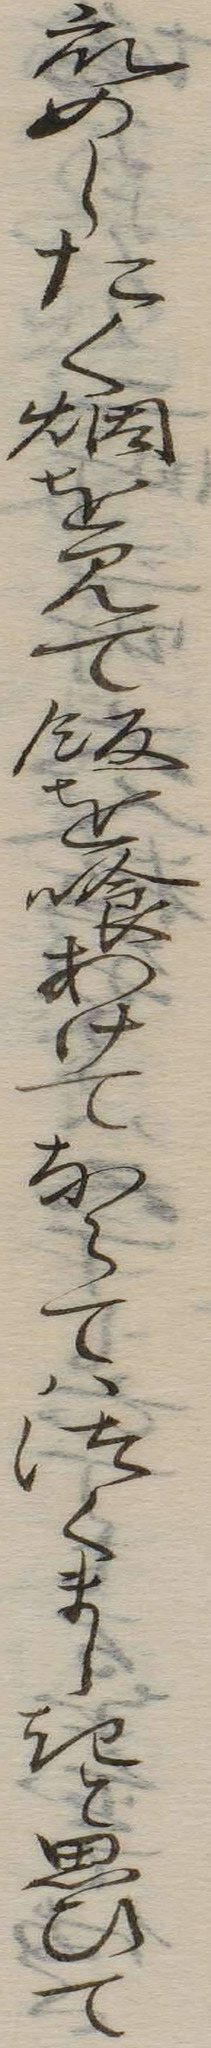衆めしたく烟を見て飯を喰あけてならてはつくましきと思ひて
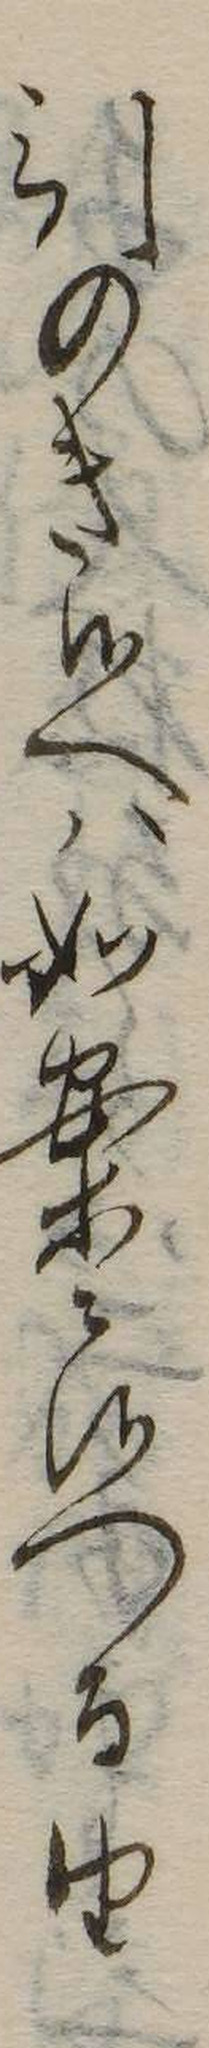引のき候へは如案ニ候つる由
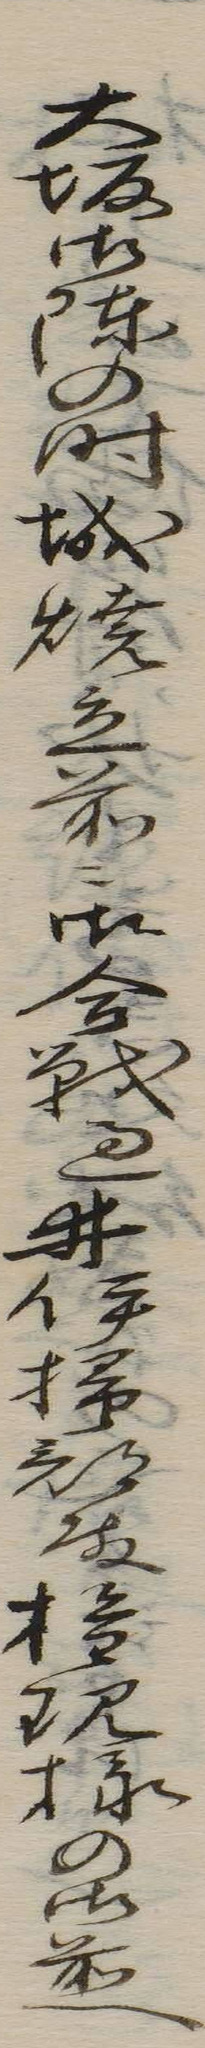一大坂御陣の時城焼立前ニ御合戦過井伊掃部殿権現様の御前へ
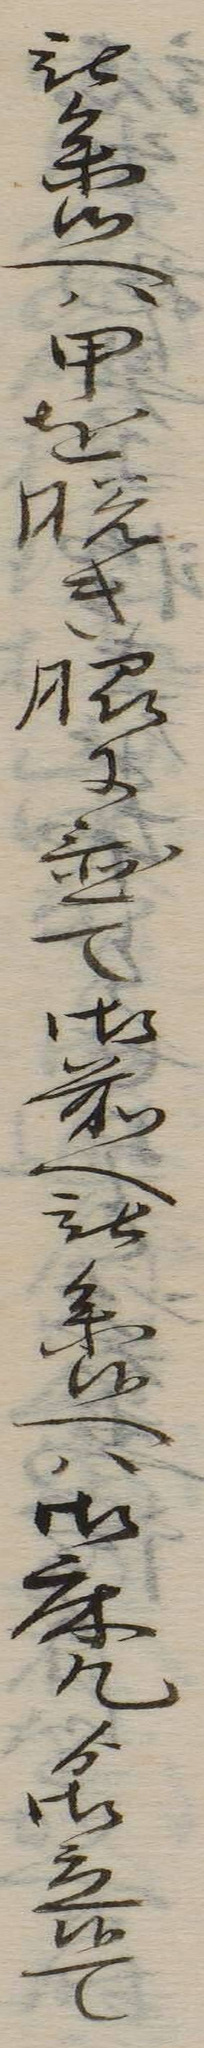被参候へは甲を脱き服に置て御前へ被参候へは御床几ゟ御立候て
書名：三河之物語
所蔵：国文学研究資料館
